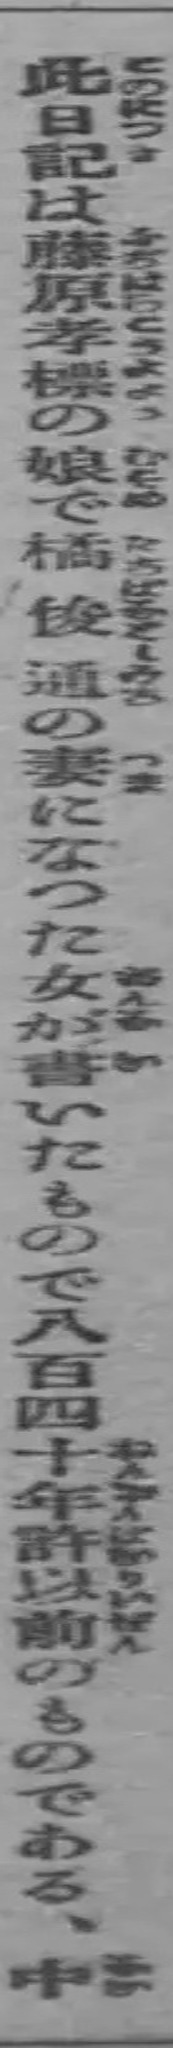此日記は藤原孝標の娘で橘俊道の妻になつた女が書いたもので八百四十年許以前のものである、中
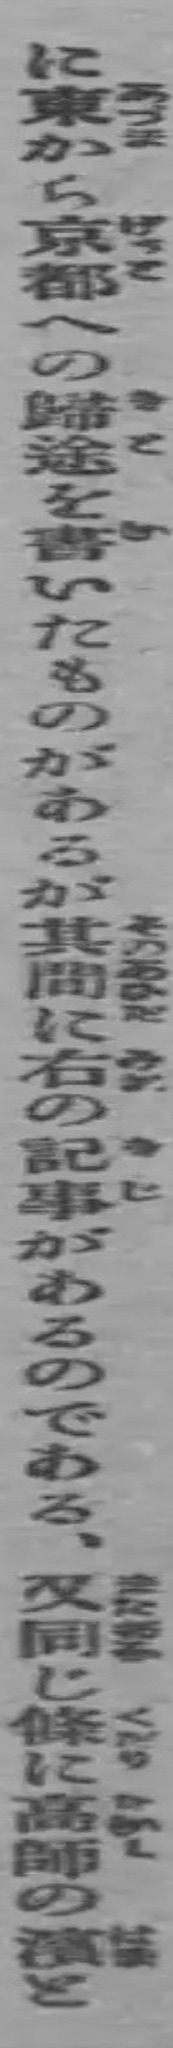に東から京都への帰途を書いたものがあるが其間に右の記事があるのである、又同じ条に高師の浜と
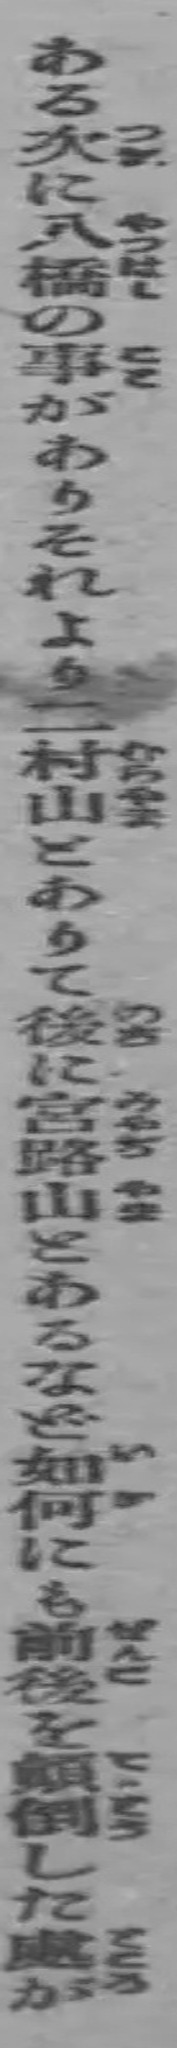ある次に八橋の事がありそれより二村山とありて後に宮路山とあるなど如何にも前後を顛倒した処が
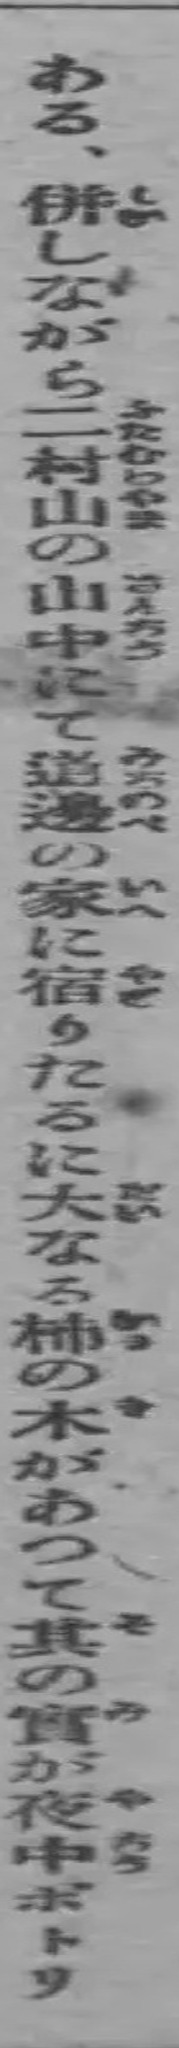ある、併しながら二山村の山中にて道辺の家に宿りたるに大なる柿の木があつて其の実が夜中ポトリ
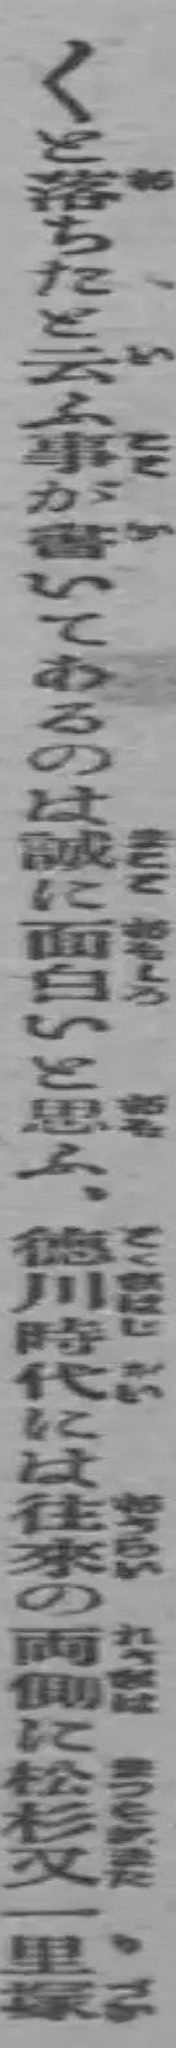〳〵と落ちたと云ふ事が書いてあるのは誠に面白いと思ふ、徳川時代には往来の両側に松杉又一里塚
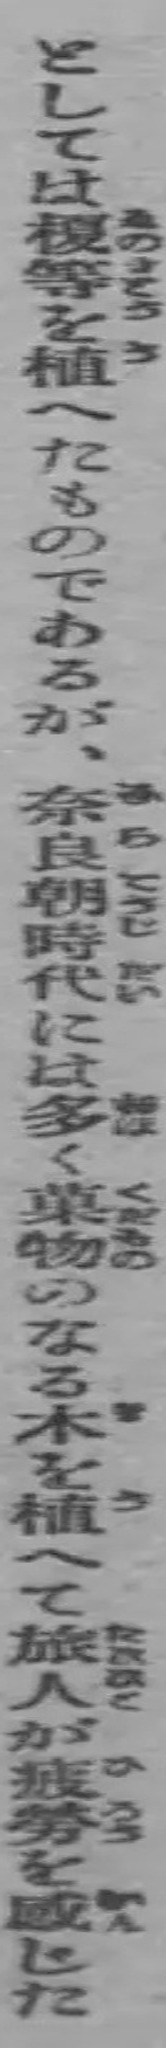としては榎等を植へたものであるが、奈良朝時代には多く菓物のなる木を植へて旅人が疲労を感じた
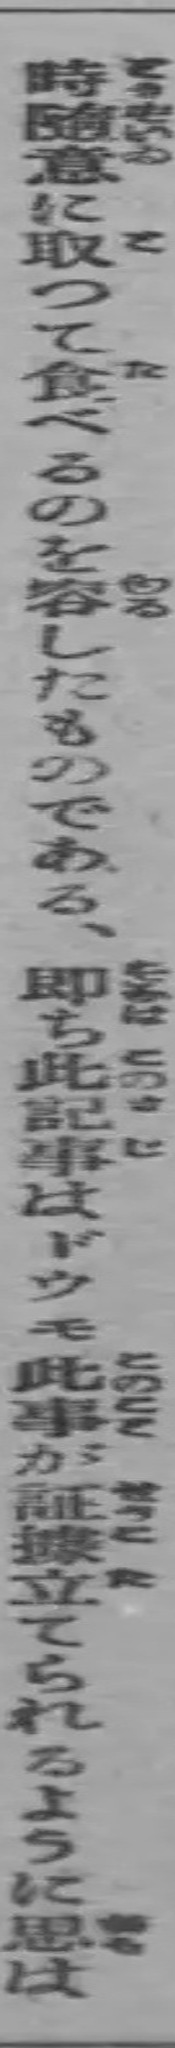時随意に取つて食べるのを容したものである、即ち此記事はドウモ此事が証拠立てられるように思は
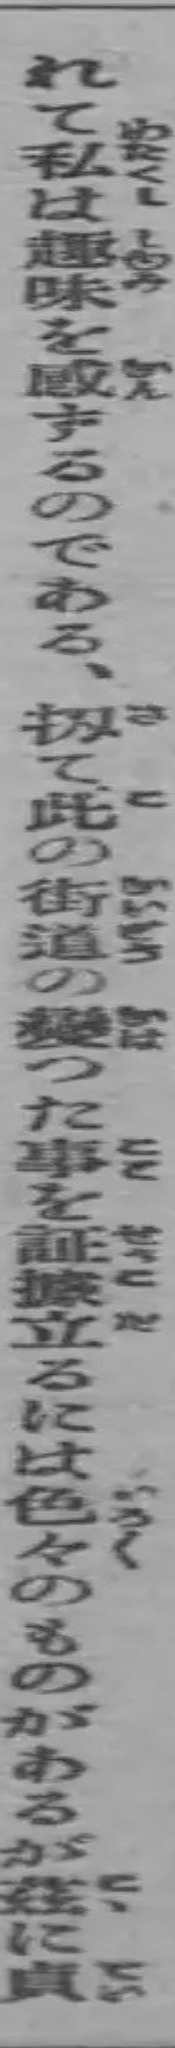れて私は趣味を感ずるのである、扨て此の街道の変つた事を証拠立るには色々のものがあるが茲に貞
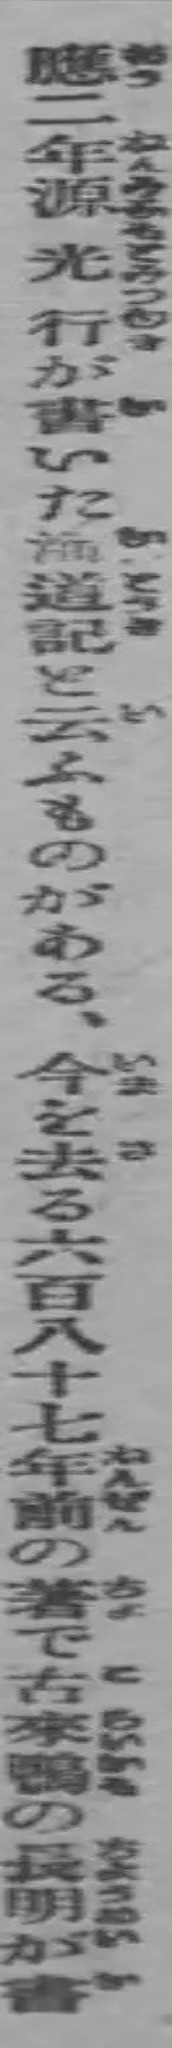応二年源光行が書いた海道記と云ふものがある、今を去る六百八十七年前の著で古来鴨の長明が書
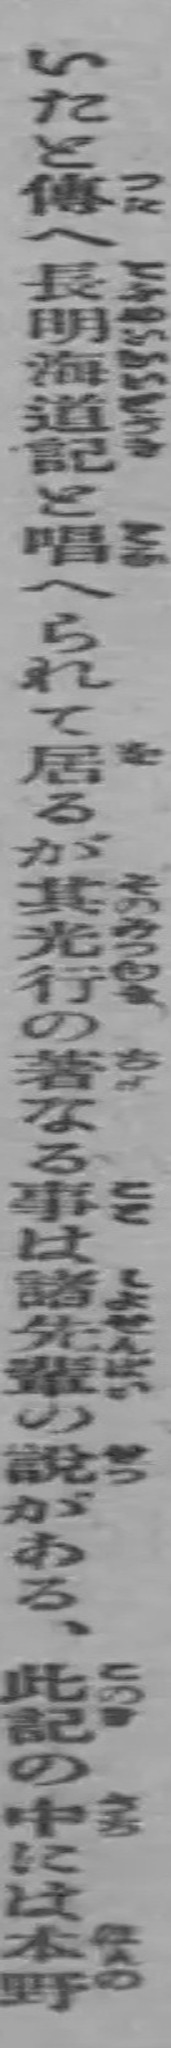いたと伝へ長明海道記と唱へられて居るが其光行の著なる事は諸先輩の説がある、此記の中には本野
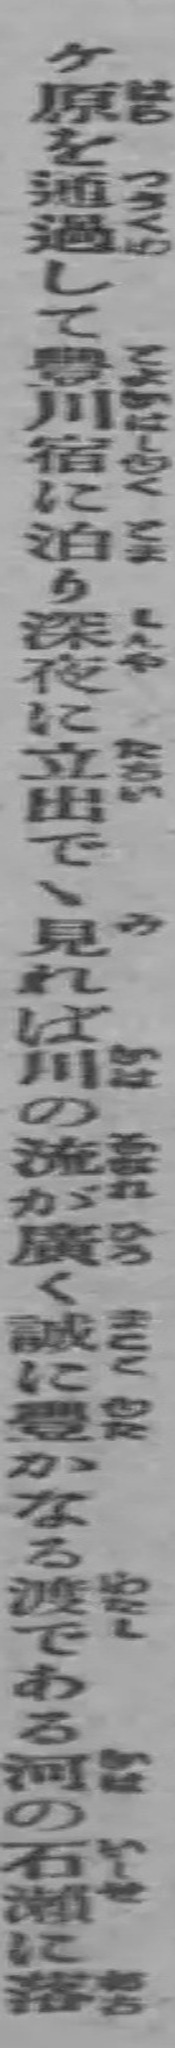豊川宿ケ原を通過して豊川宿に泊り深夜に立出でゝ見れば川の流が広く誠に豊かなる渡である河の石瀬に落
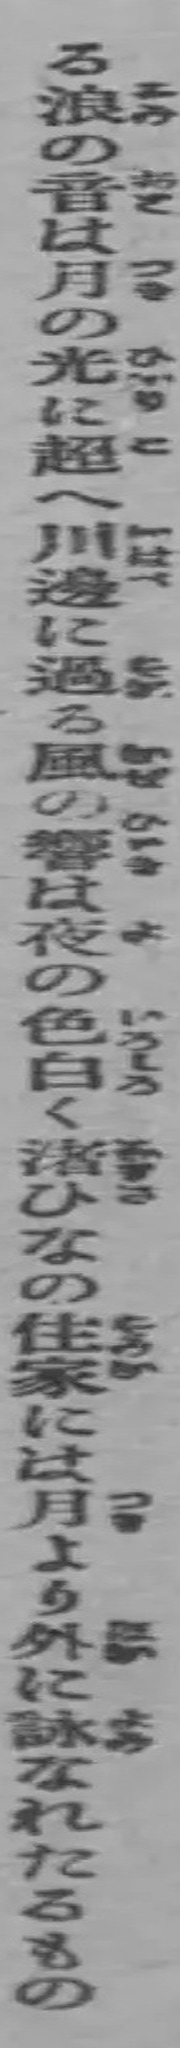る浪の音は月の光に超へ川辺に過る風の響は夜の色白く渚ひなの住家には月より外に詠なれたるもの
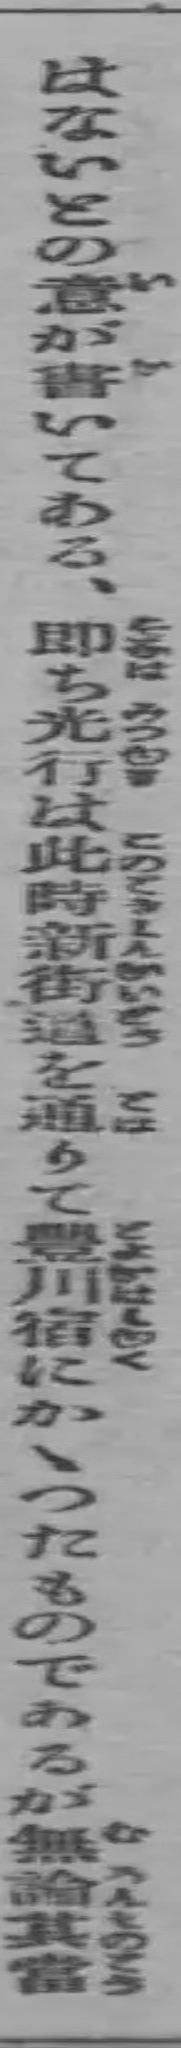はないとの意が書いてある、即ち光行は此時新街道を通りて豊川宿にかゝつたものであるが無論其当
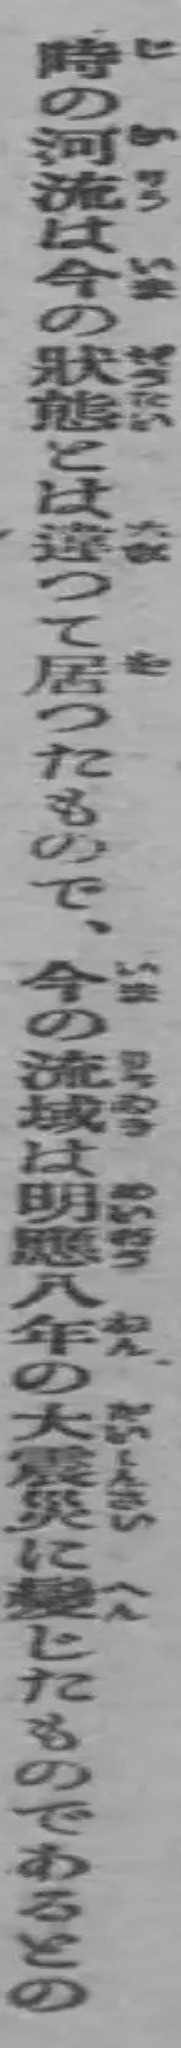時の河流は今の状態とは違つて居つたもので、今の流域は明応八年の大震災に変じたものであるとの
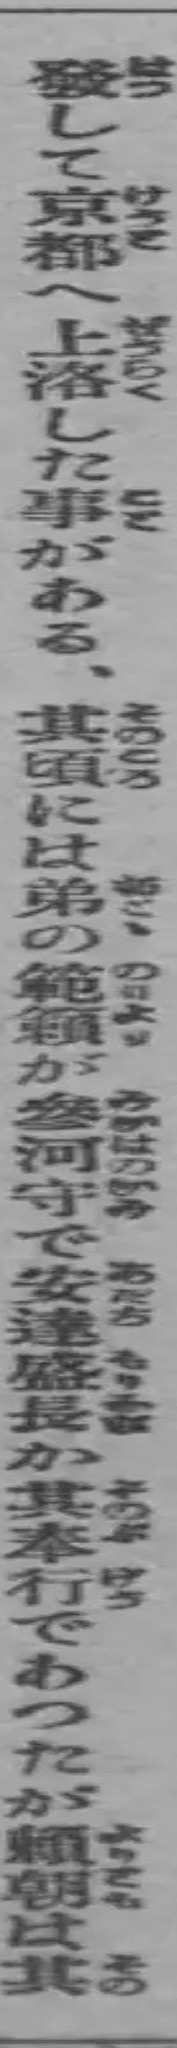発して京都へ上洛した事がある、其頃には弟の範頼が参河守で安達盛長か其奉行であつたが頼朝は其
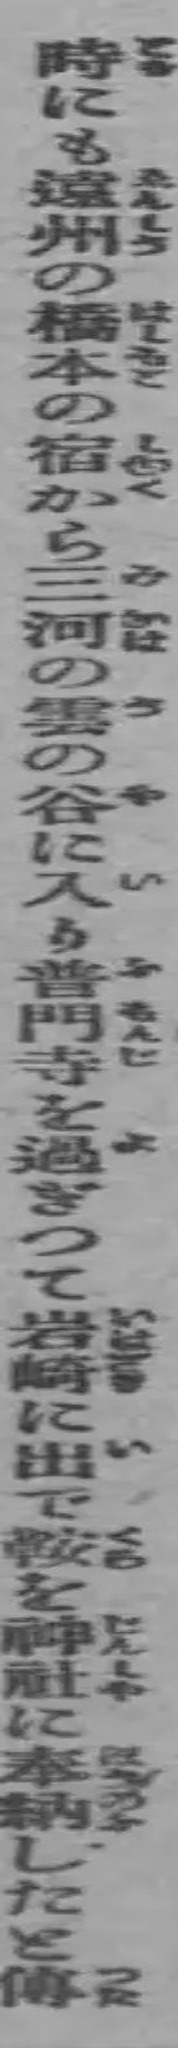時にも遠州の橋本の宿から三河の雲の谷に入り普門寺を過ぎつて岩崎に出で鞍を神社に奉納したと伝
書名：豊橋市史談
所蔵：国立国会図書館 National Diet Library, JAPAN
